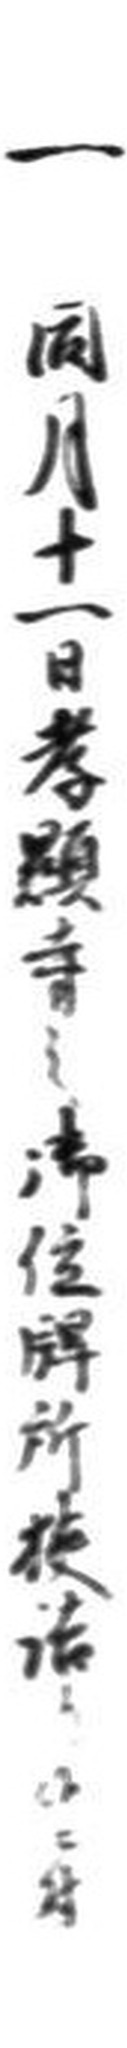一同月十一日孝顕寺之御位牌所狭詰り候ニ付
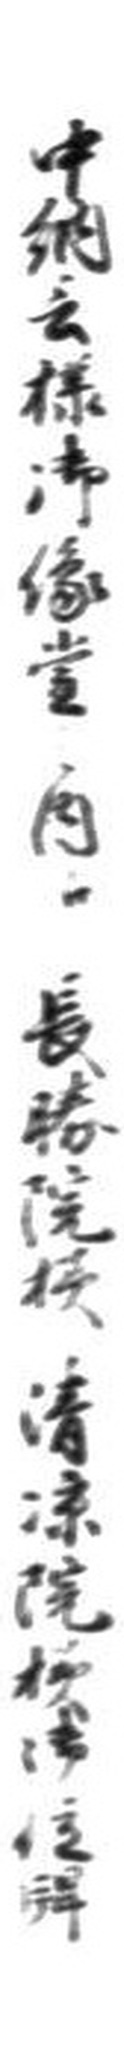中納言様御像堂之内江長勝院様清凉院様御位牌
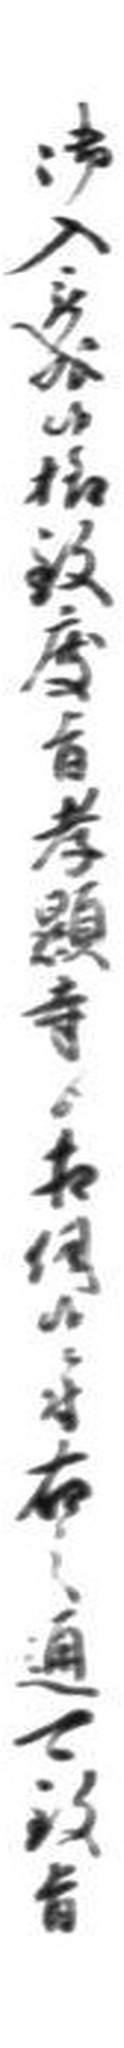御入被成候様致度旨孝顕寺ゟ相伺候ニ付右之通可致旨
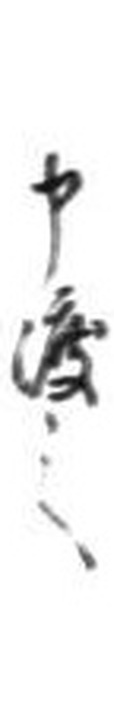申渡之

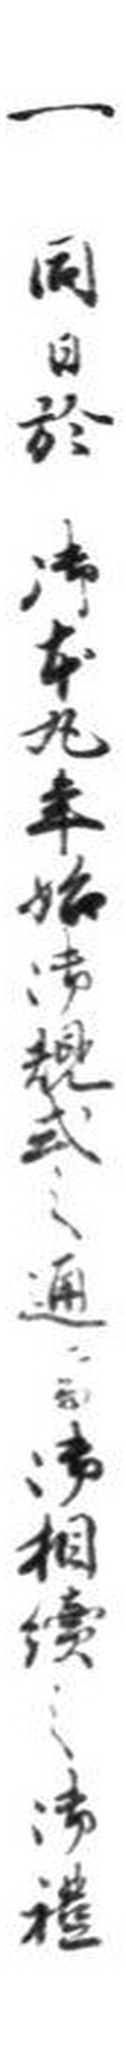一同日於御本丸年始御規式之通ニ而御相続之御礼
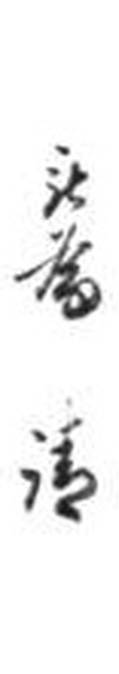被為請
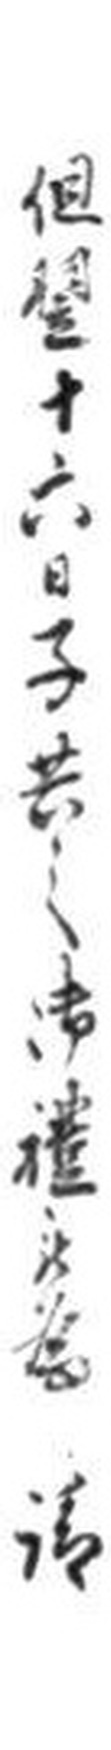但翌十六日子共之御礼被為請
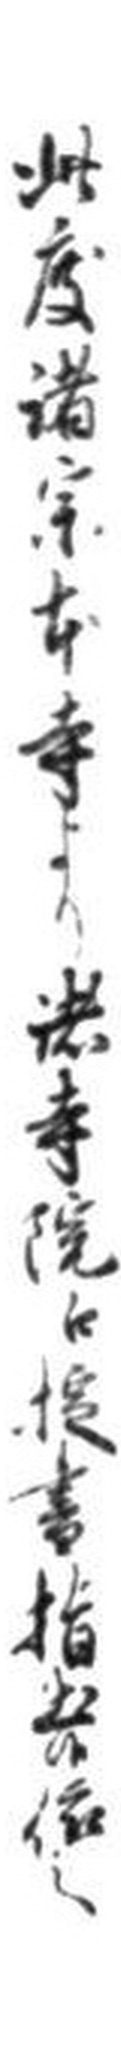此度諸宗本寺より諸寺院江掟書指出候依之
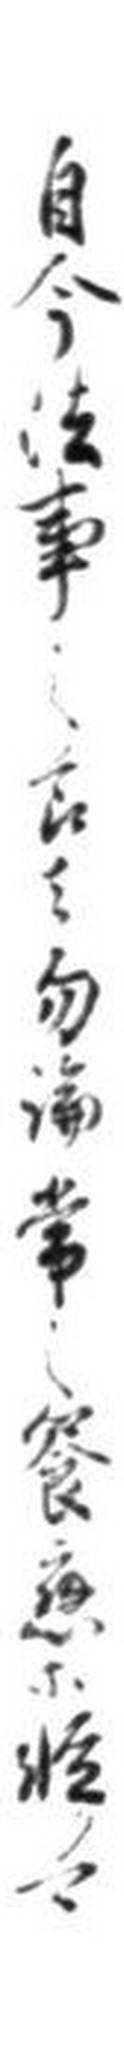自今法事之節者勿論常之饗応等軽ク可
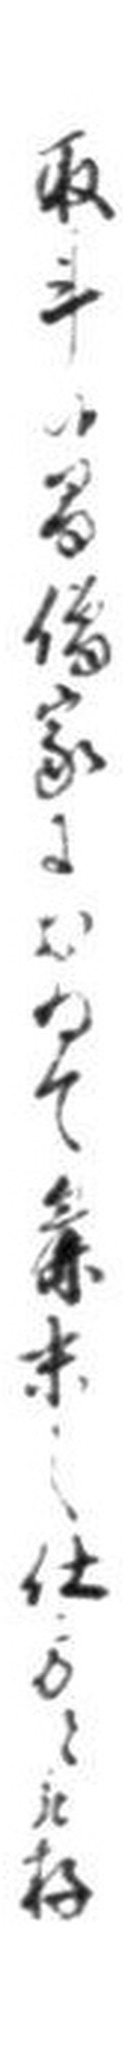取計候間僧家におゐて麁末之仕方と被存
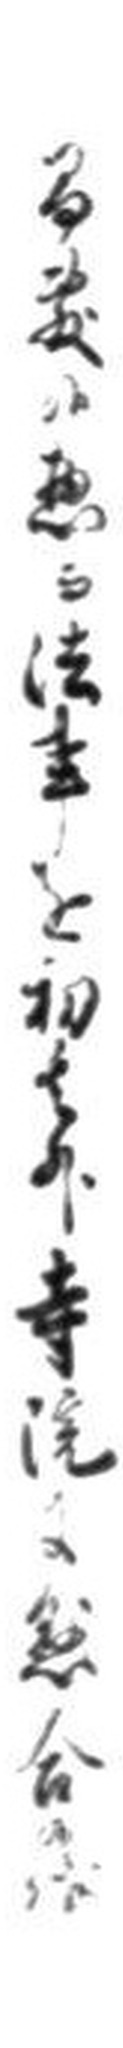間敷候惣而法事を初其外寺院に懸合候儀
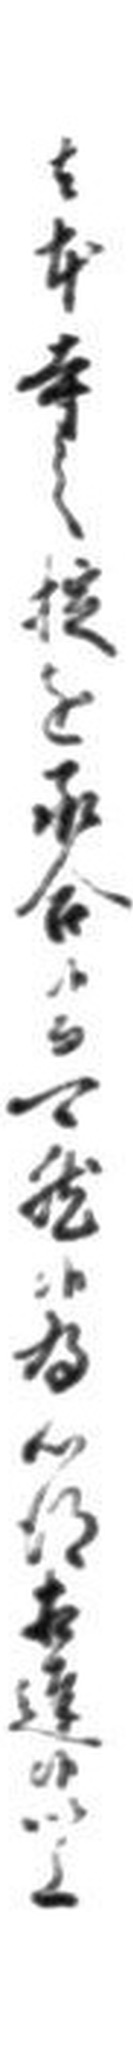者本寺之掟を承合候而可然候為心得相達候以上
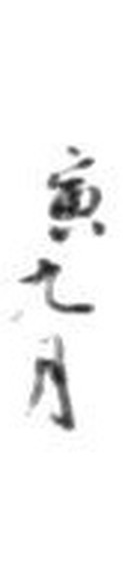寅九月
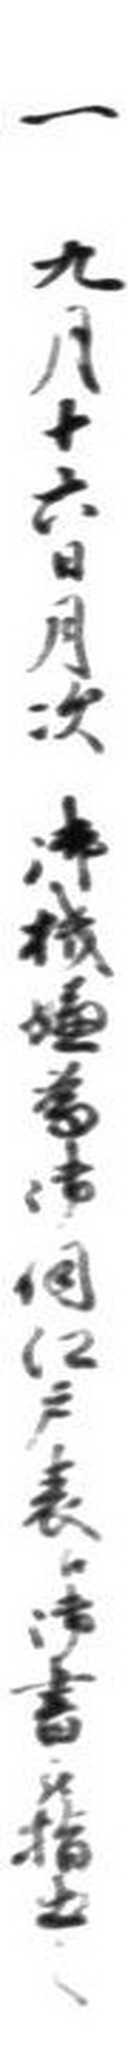一九月十六日月次御機嫌為御伺江戸表江御書被指出之
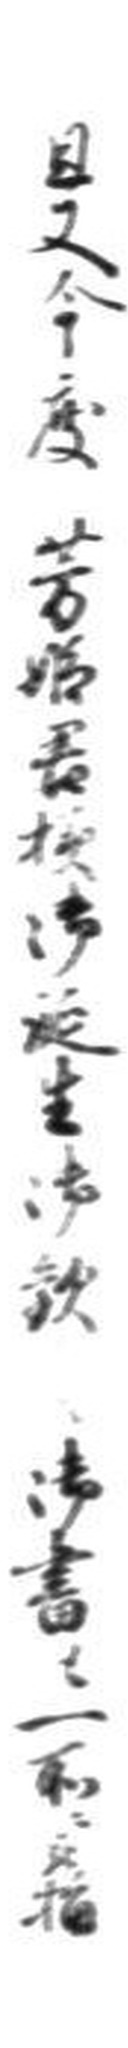且又今度芳姫君様御誕生御歓之御書も一所ニ被指
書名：家譜 三十五 宗昌公 従享保六年到同七年
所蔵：福井県文書館 Fukui Prefectural Archives
